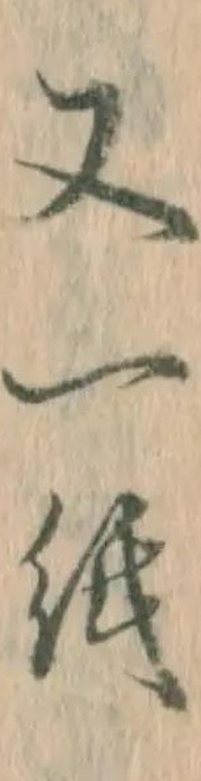又一紙
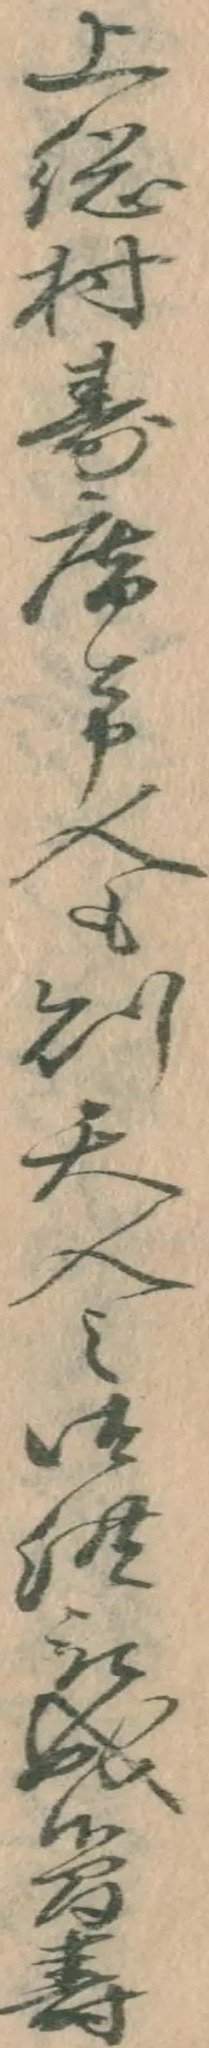上総村寿庵と申人も則天人之御供被成候間寿
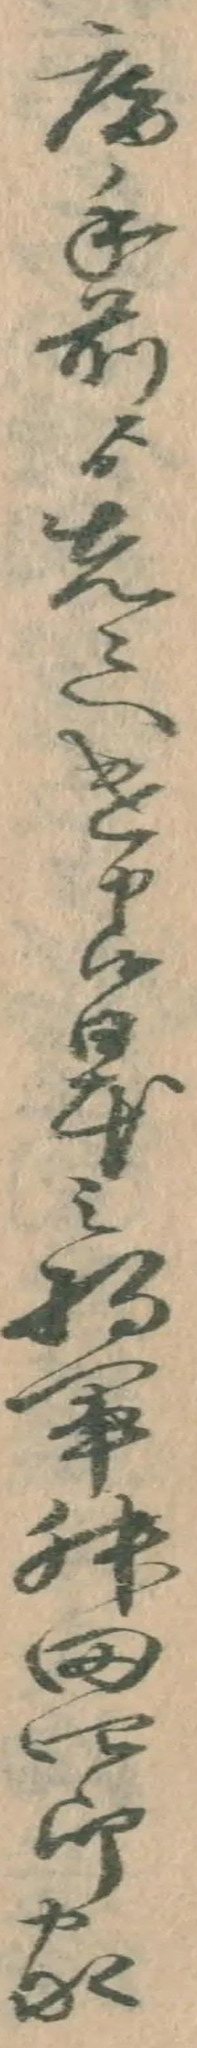庵手前ゟ先々へ遣申候日本之将軍升田四郎家
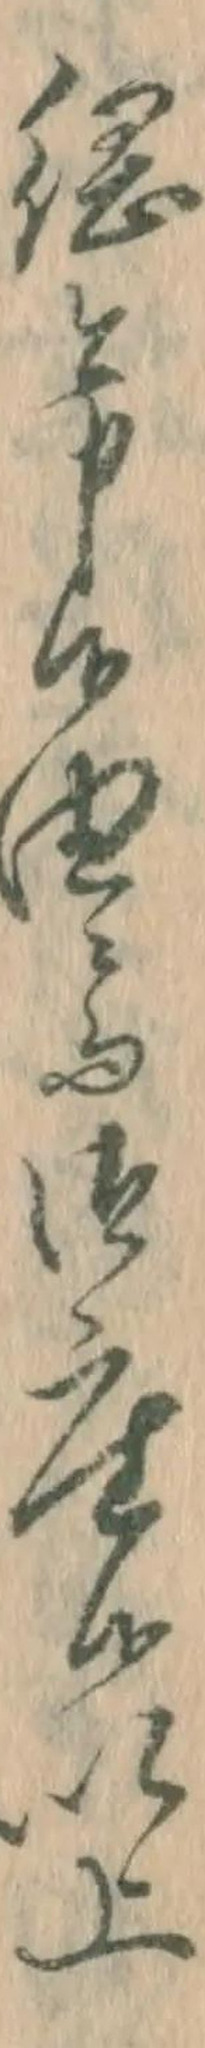綱と申候由に而御座候以上
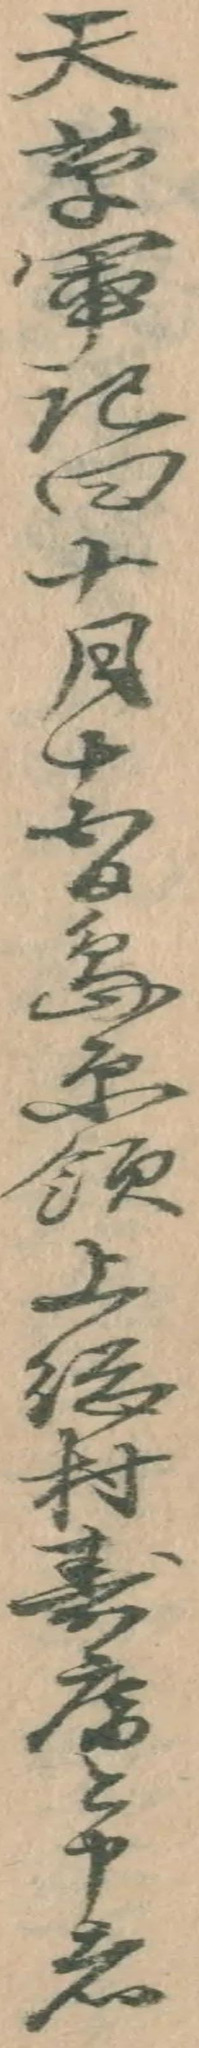天草軍記日十月十五日島原領上総村寿庵と申者
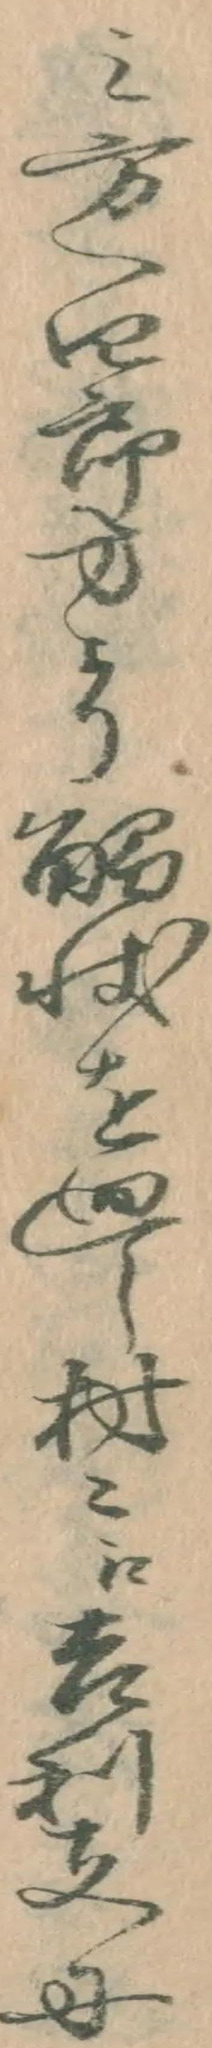之方へ四郎方より触状を廻し村々え吉利支丹

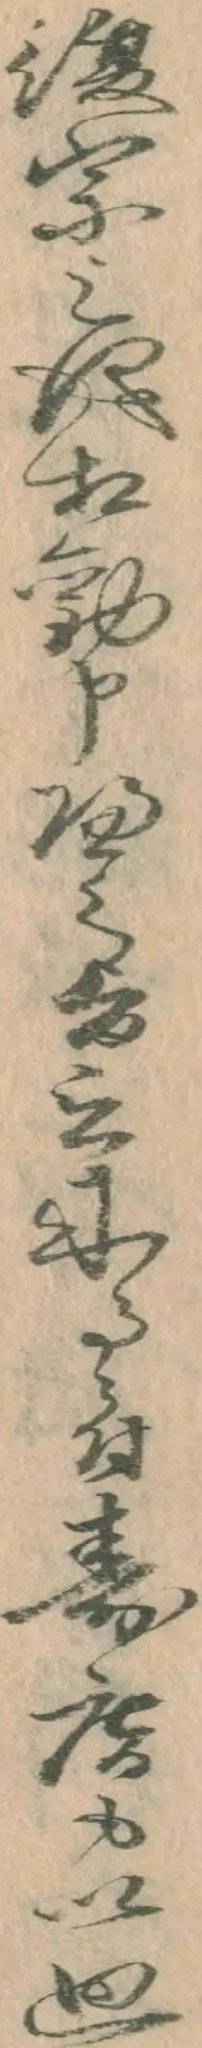復宗之儀相勧申へく旨云来るに付寿庵も以廻
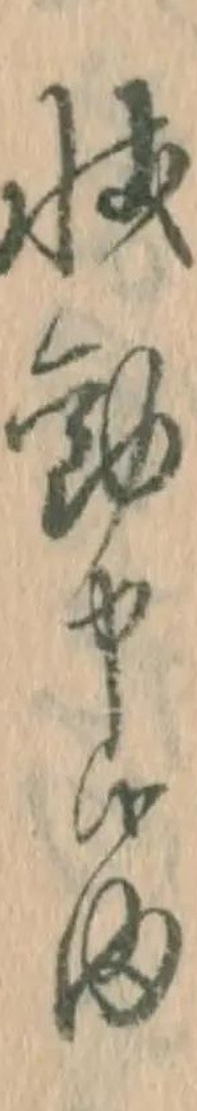状勧申候由
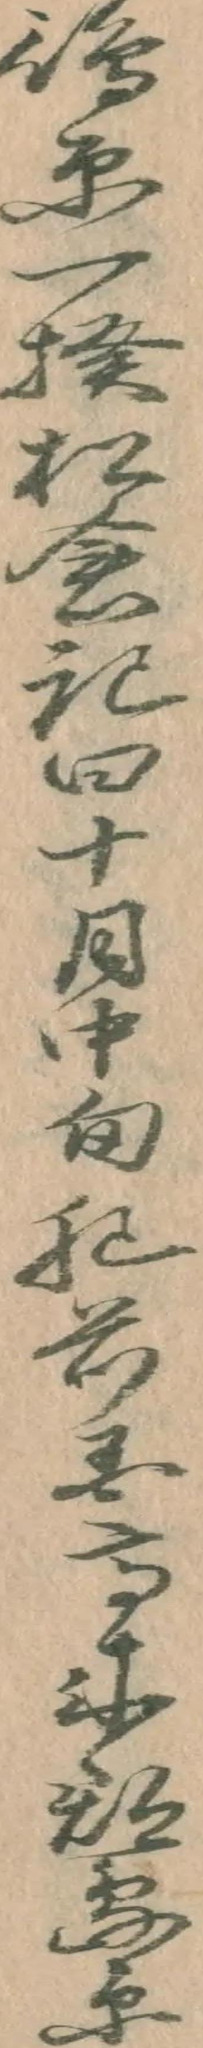島原一揆松倉記日十月中旬肥前高来郡島原
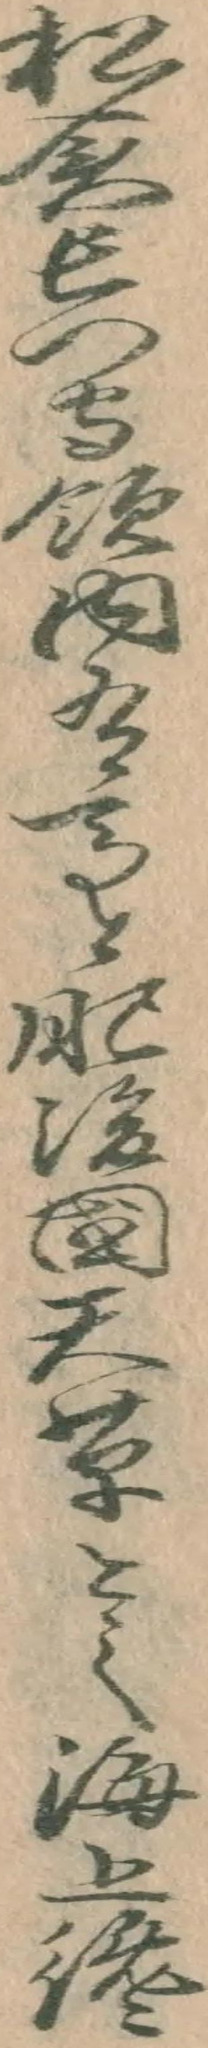松倉長門守領内有馬と肥後国天草と之海上纔
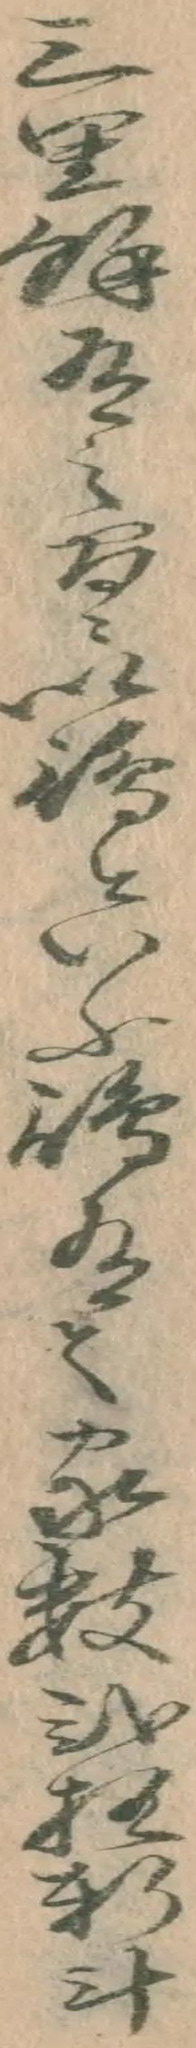三里余有之間に以島といふ島有て家数弐拾軒斗
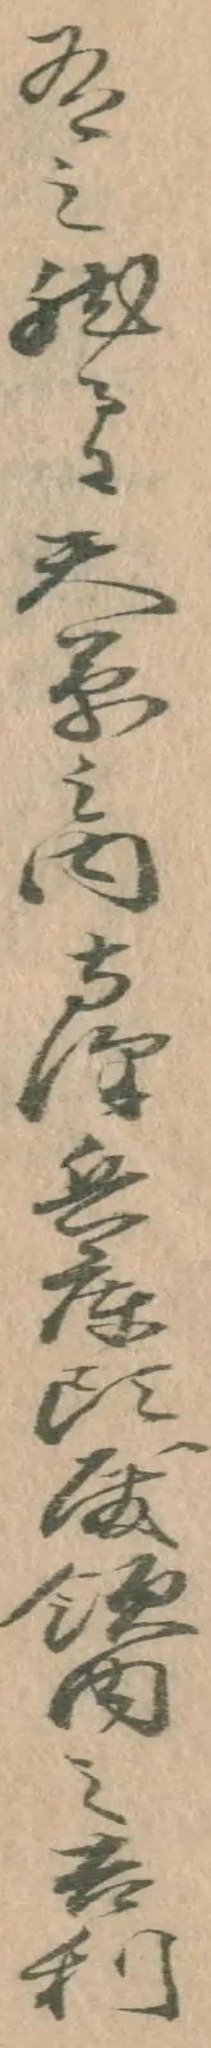有之然るに天草之内寺沢兵庫頭殿領内之吉利
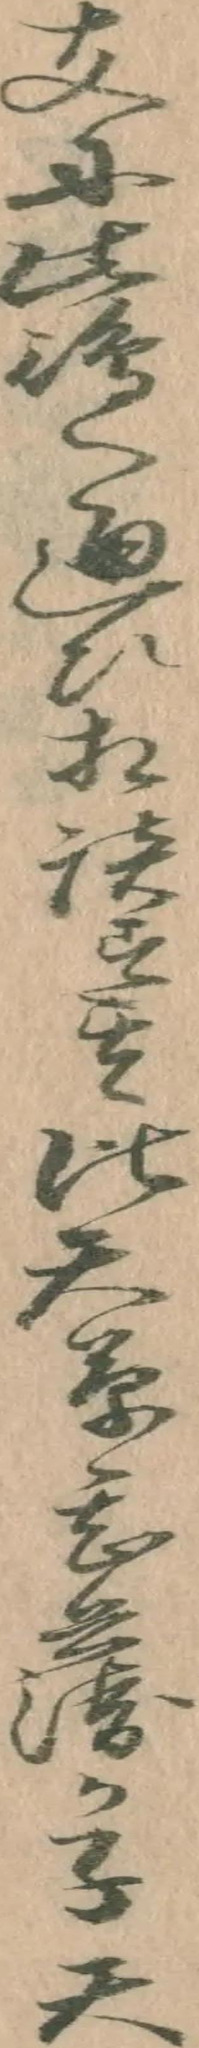支丹此島へ通ひ相談す其比天草甚兵衛か子天
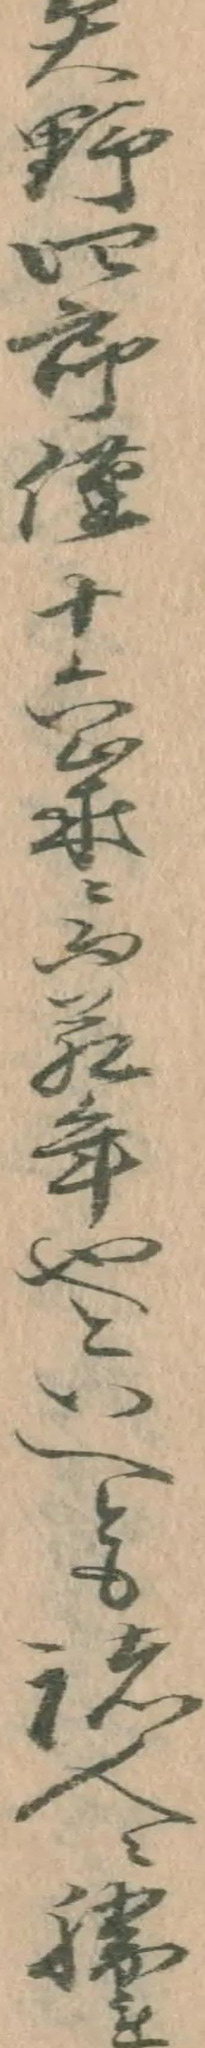矢野四郎僅十六歳に而若年也といへとも諸人に勝れ
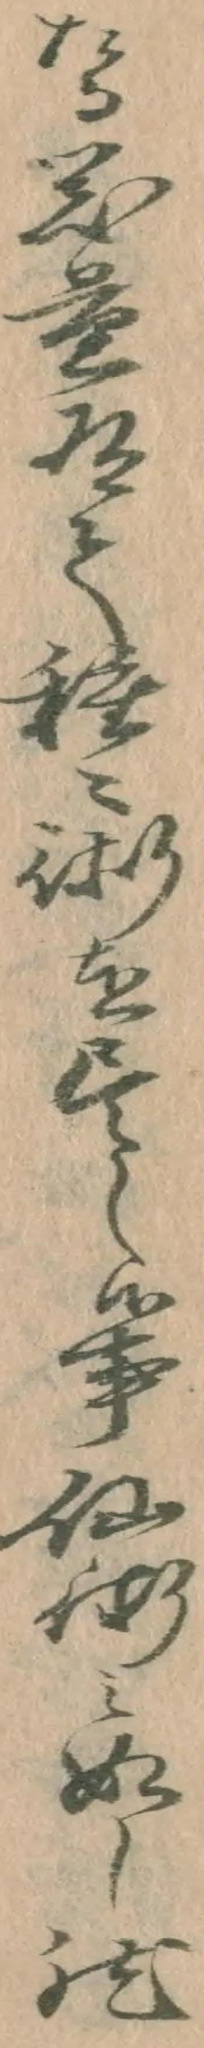たる器量有て種々術を尽し候事仙術之如し然
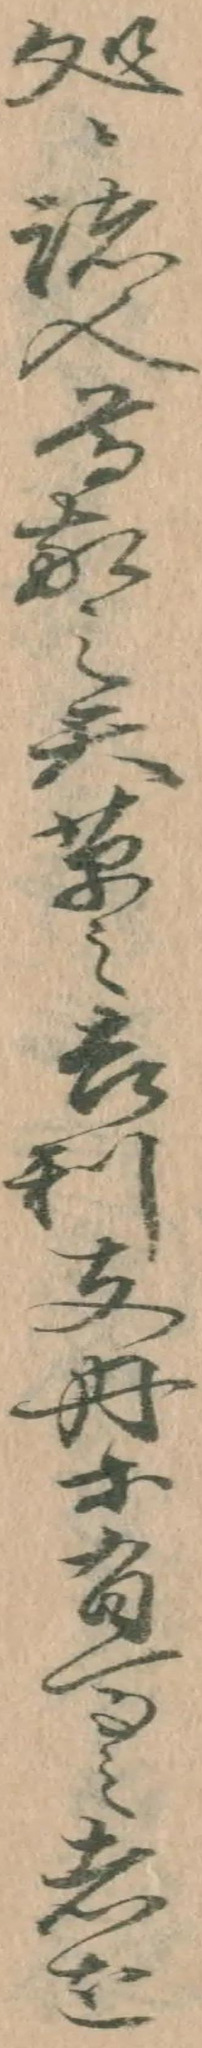処に諸人尊敬之天草之吉利支丹等有馬之者を
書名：切支丹御退治記 49巻. [1]
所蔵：国立国会図書館 National Diet Library, JAPAN
